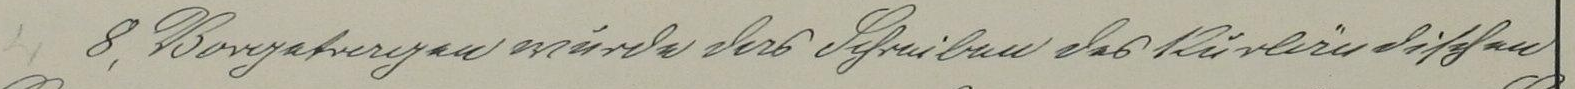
8. Vorgetragen wurde das Schreiben des kurländischen
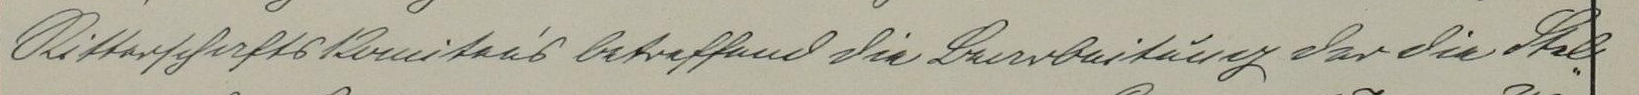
Ritterschaftskomitees betreffend die Bearbeitung der die Stel-
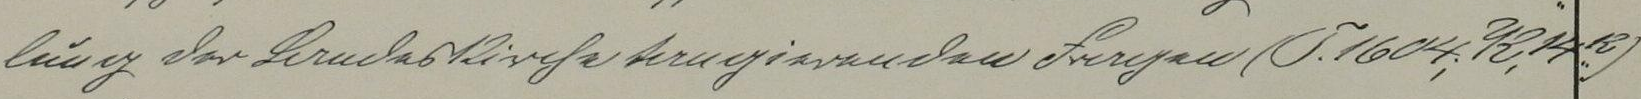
lung der Landeskirche tangierenden Fragen (T.1604; K.14k).
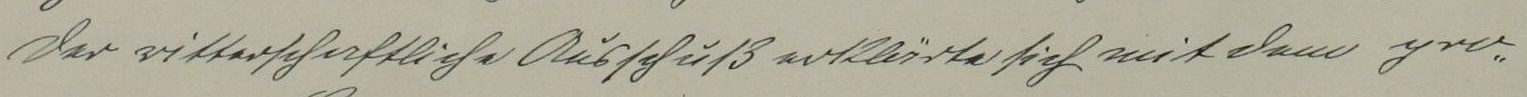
Der ritterschaftliche Ausschuß erklärte sich mit dem pro-
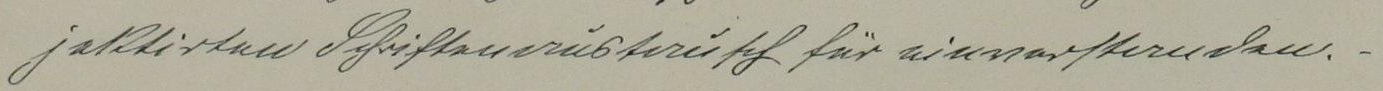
jektirten Schriftenaustausch für einverstanden.
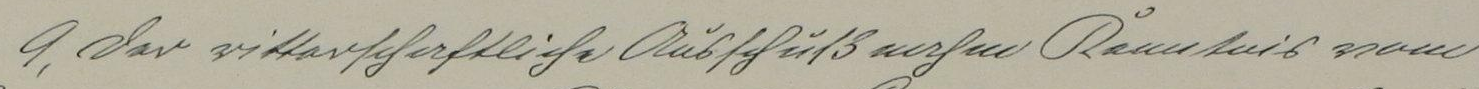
9. Der ritterschaftliche Ausschuß nahm Kenntnis vom
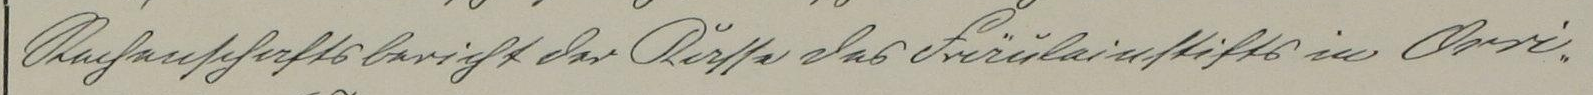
Rechenschaftsbericht der Kasse des Fräuleinstifts in Orri-
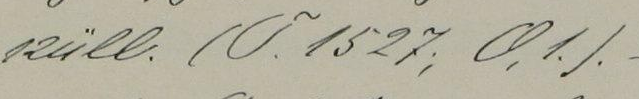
küll (T.1527; O.1).
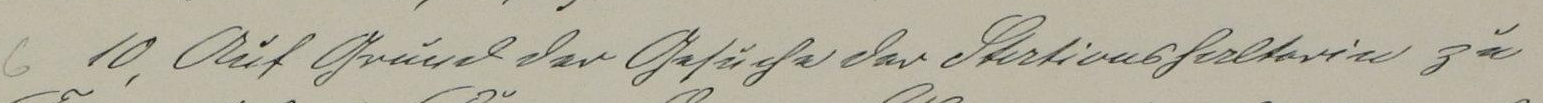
10. Auf Grund der Gesuche der Stationshalterin zu
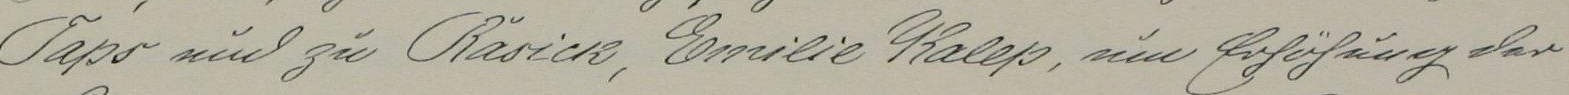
Taps und zu Rasick, Emilie Kalep, um Erhöhung der
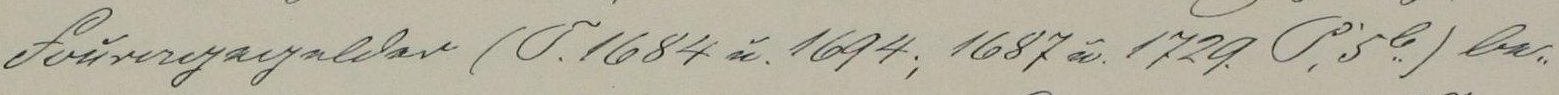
Fouragegelder (T.1684 u. 1694; 1687 u. 1729; P.5b) be-
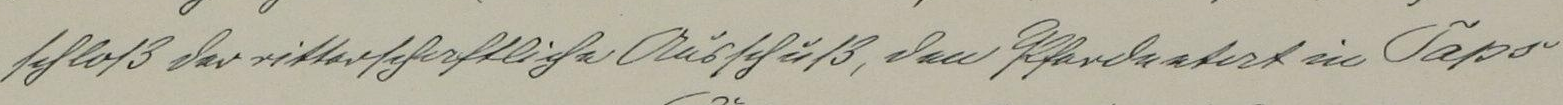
schloß der ritterschaftliche Ausschuß, den Pferdeetat in Taps
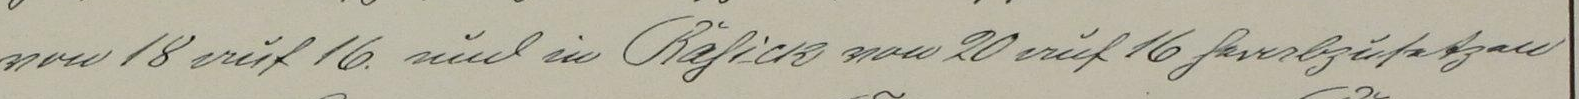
von 18 auf 16. und in Rasick von 20 auf 16 herabzusetzen
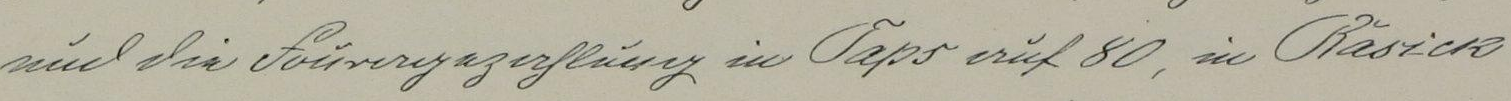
und die Fouragezahlung in Taps auf 80, in Rasick
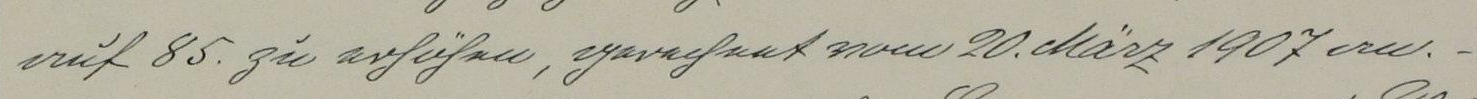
auf 85. zu erhöhen, gerechnet vom 20. März 1907 an.
